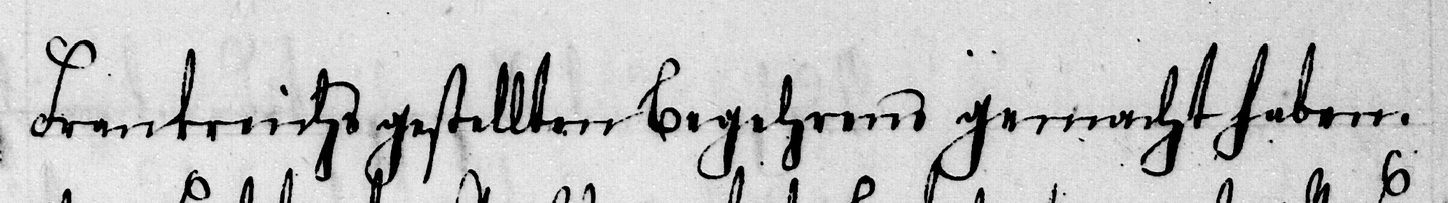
Frankreichs gestellten Begehrens gemacht haben.
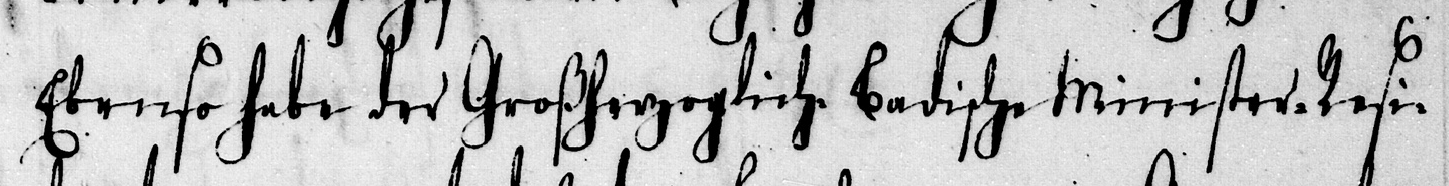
Ebenso habe der Großherzoglich Badische Minister-Resi¬
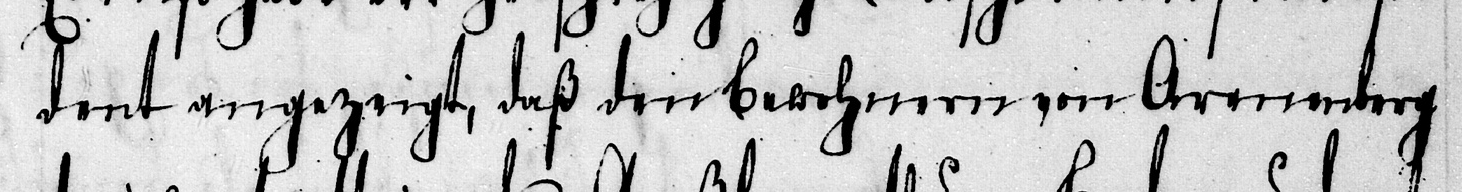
dent angezeigt, daß den Bewohnern von Arenenberg
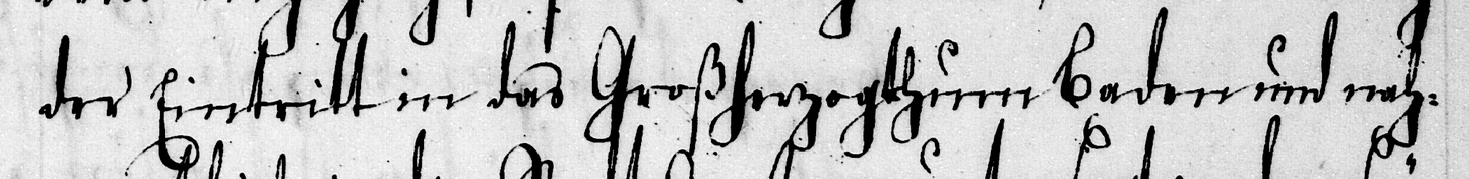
der Eintritt in das Großherzogthum Baden und nah¬
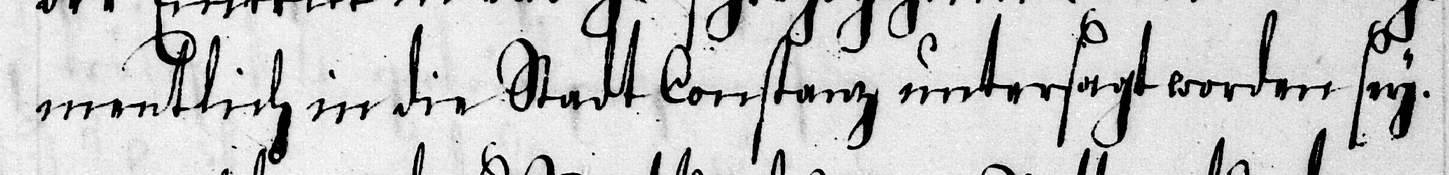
mentlich in die Stadt Constanz untersagt worden sey.
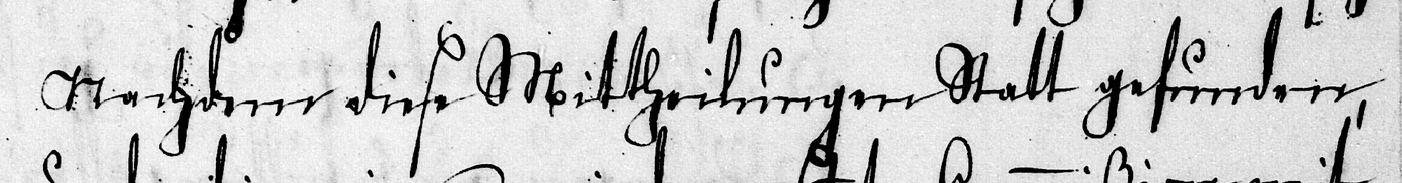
Nachdem diese Mittheilungen Statt gefunden,
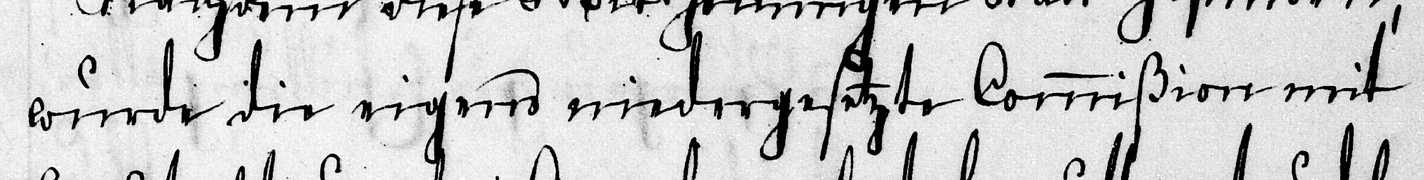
wurde die eigens niedergesetzte Commißion mit
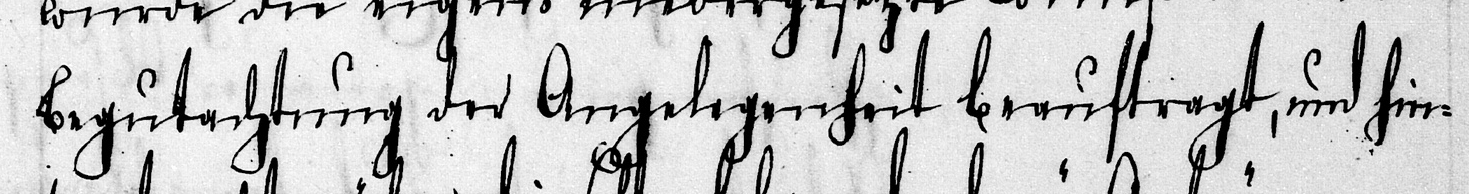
Begutachtung der Angelegenheit beauftragt, und hin¬
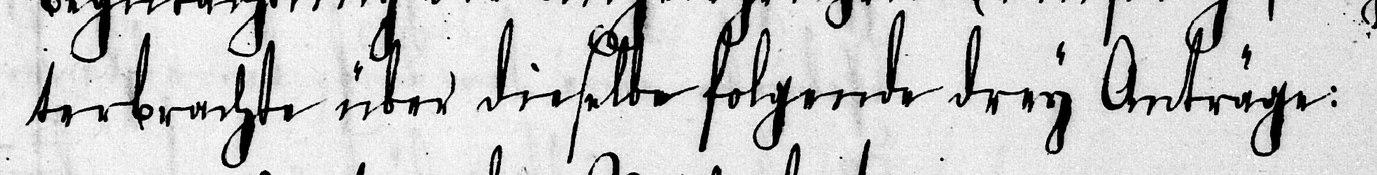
terbrachte über dieselbe folgende drey Anträge:
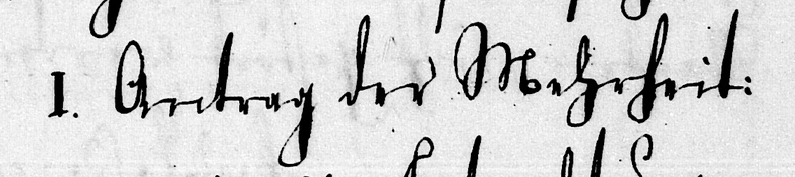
1. Antrag der Mehrheit:
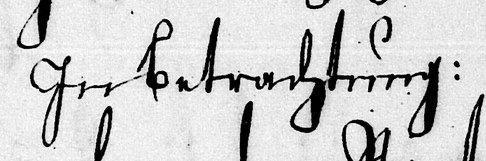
In Betrachtung:
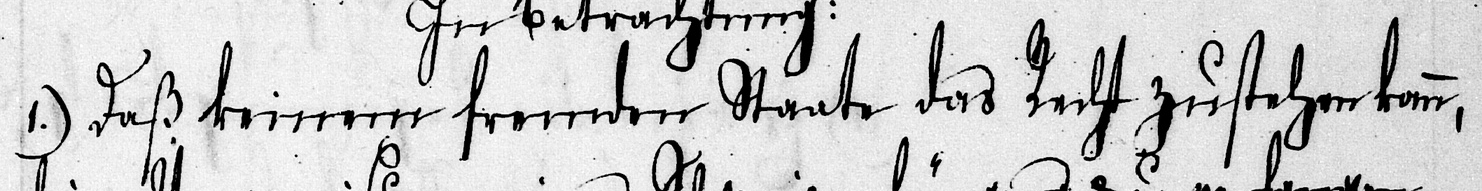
1.) Daß keinem fremden Staate das Recht zustehen
